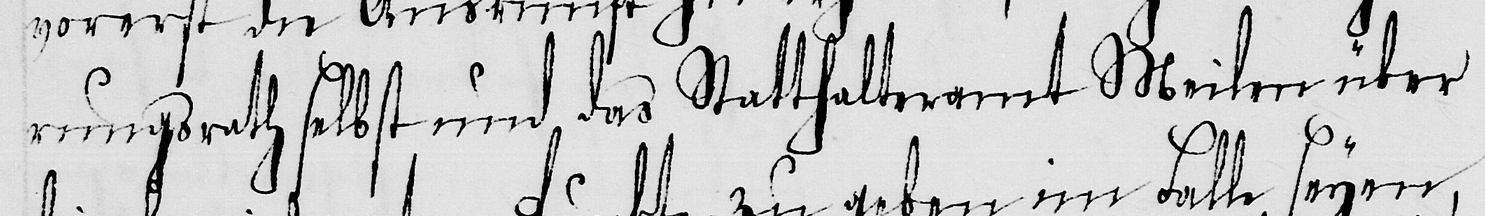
rungsrath selbst und das Statthalteramt Meilen über
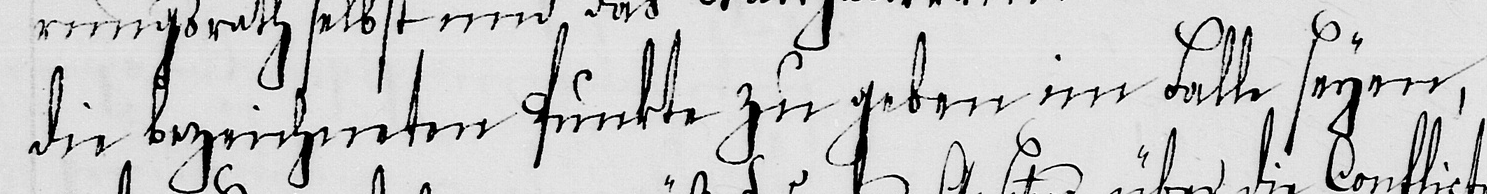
die bezeichneten Punkte zu geben im Falle seyen,
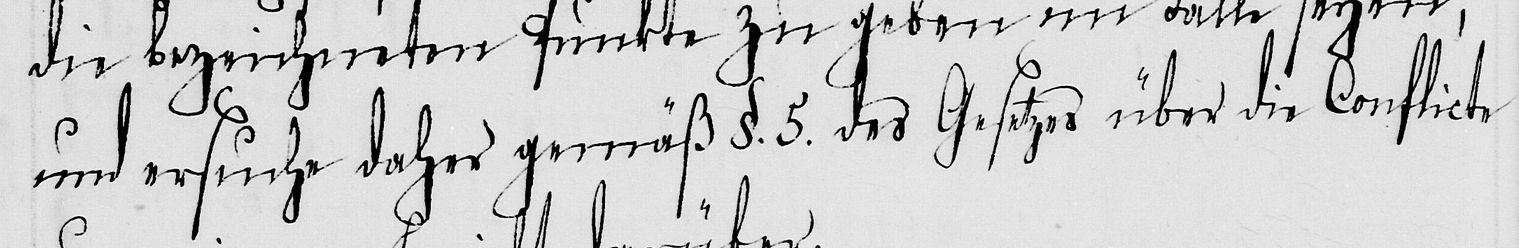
und ersuche daher gemäß §. 5. des Gesetzes über die Conflicte
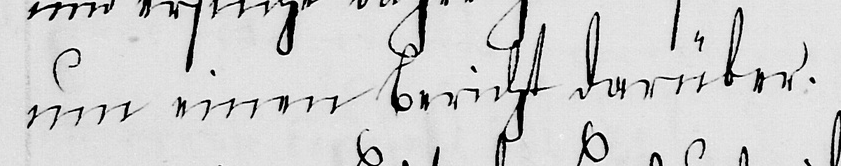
um einen Bericht darüber.
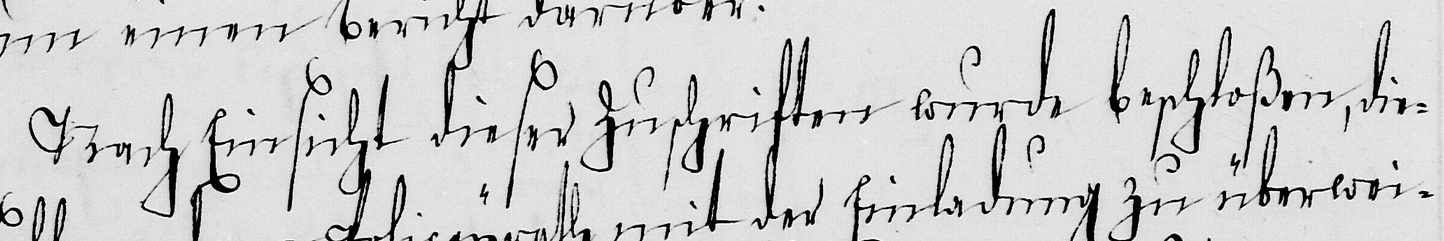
Nach Einsicht dieser Zuschriften wurde beschloßen, di¬
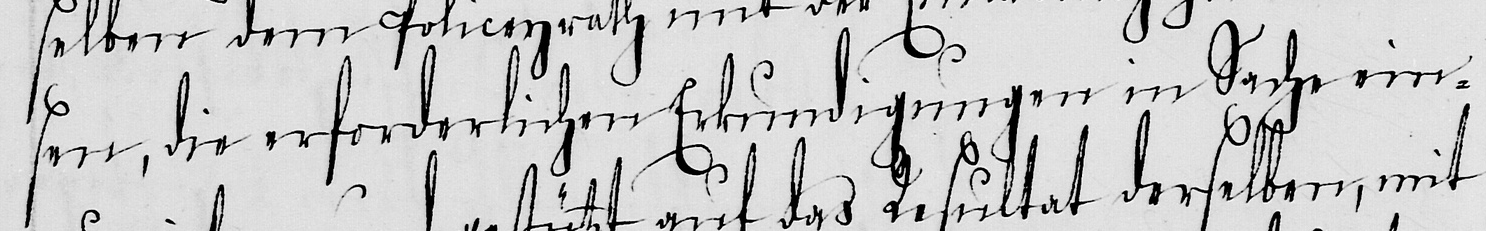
sen, die erforderlichen Erkundigungen in Sache ein¬
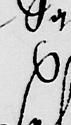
e.
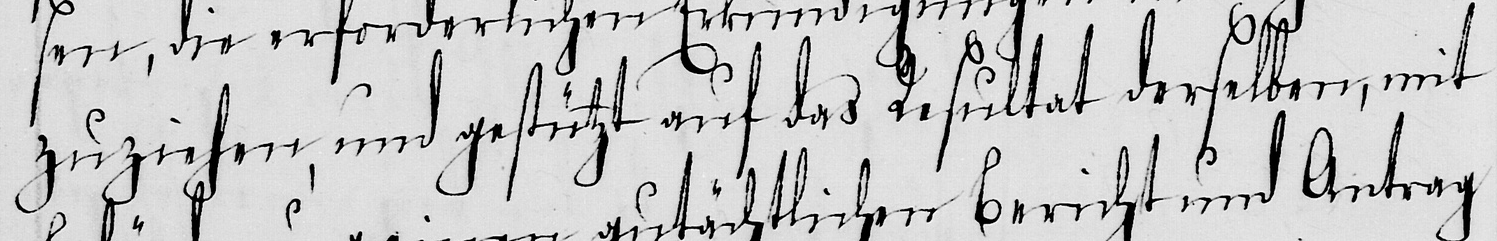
zuziehen, und gestützt auf das Resultat derselben, mit
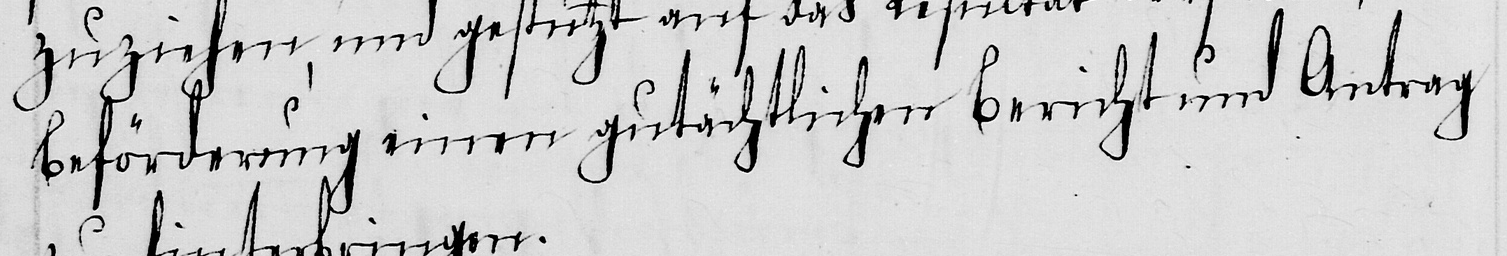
Beförderungen einen gutächtlichen Bericht und Antrag
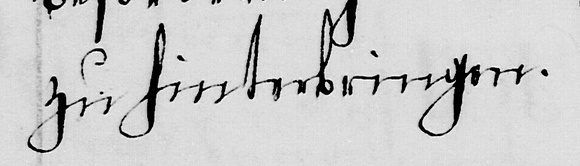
zu hinterbringen.
